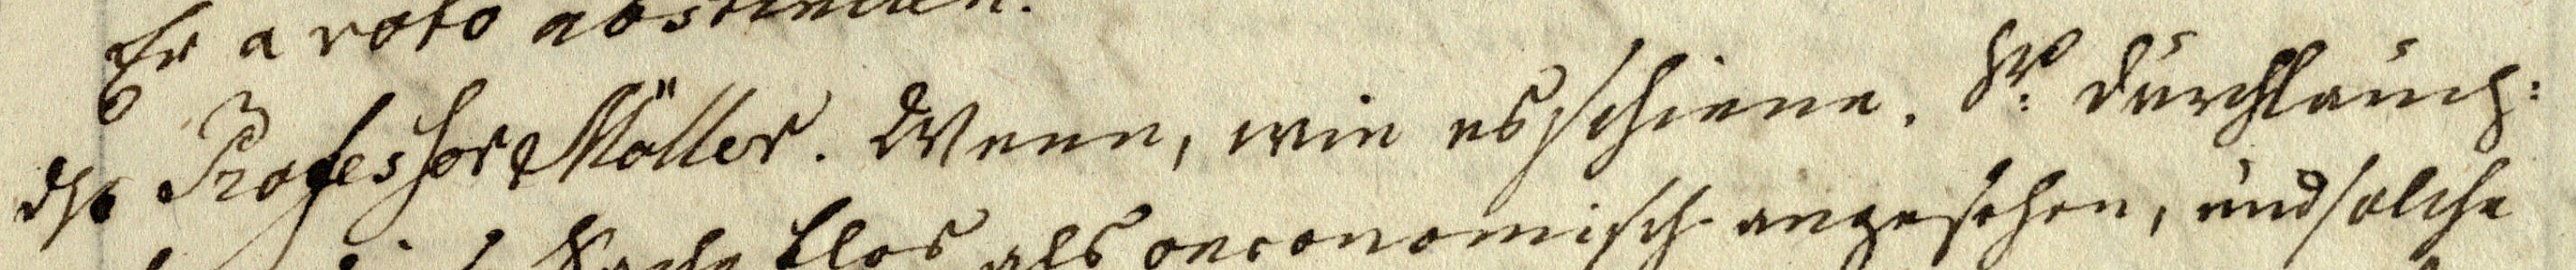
dh Professor Möller. Wenn, wie es schiene, Sr. Durchlauch¬
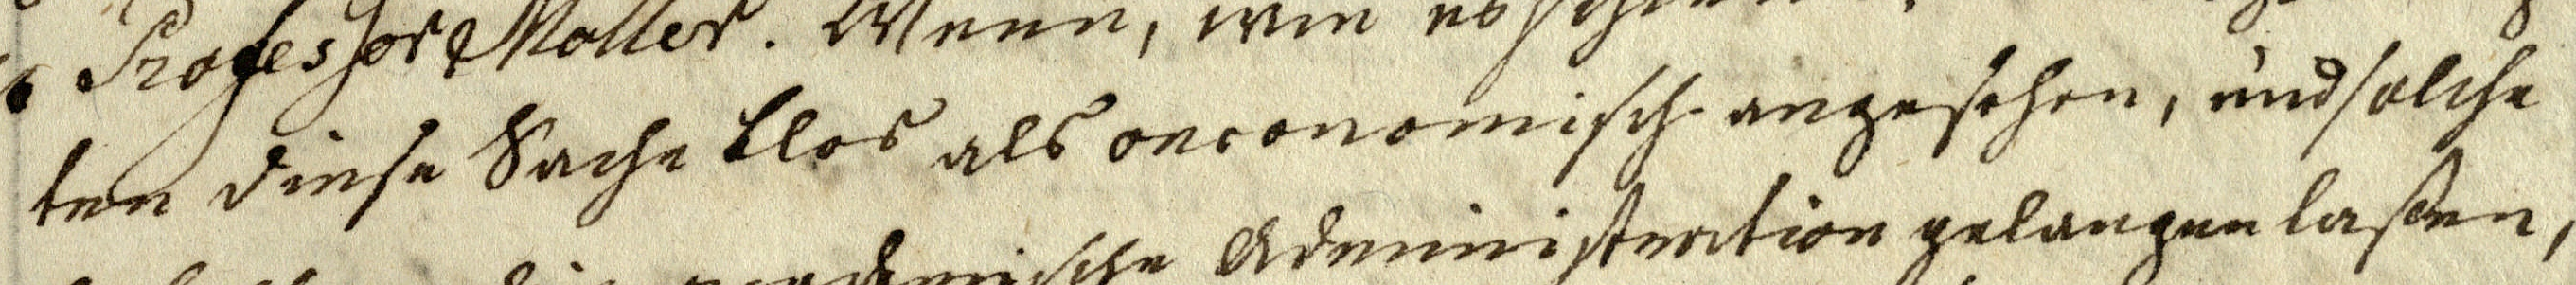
ten diese Sache blos als oeconomisch angesehen, und solche
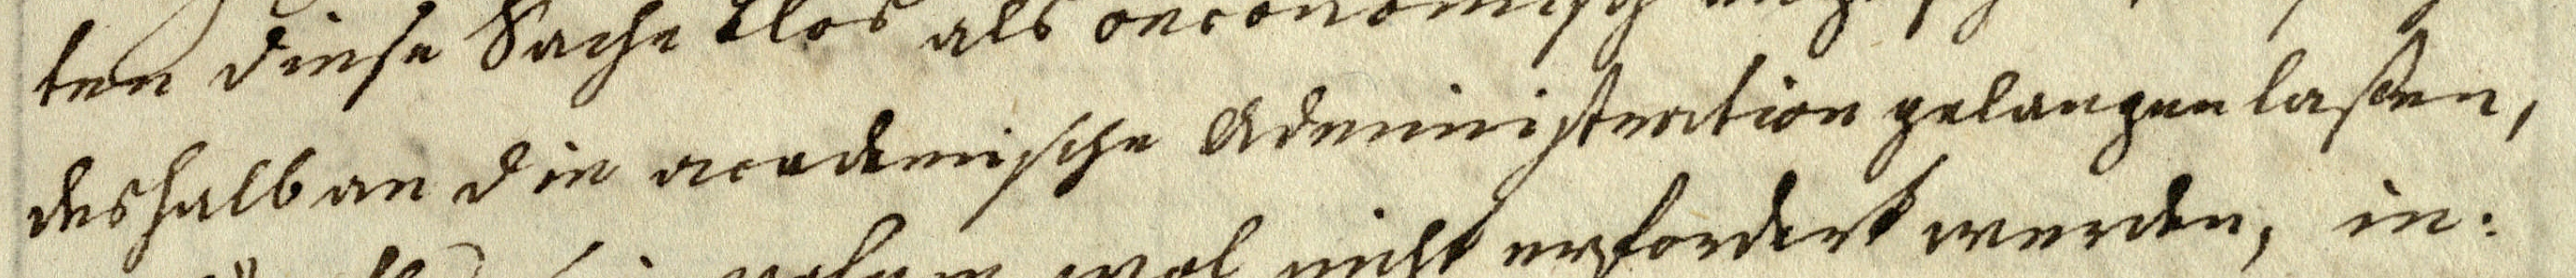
deshalb an die academische Administration gelangen laßen,
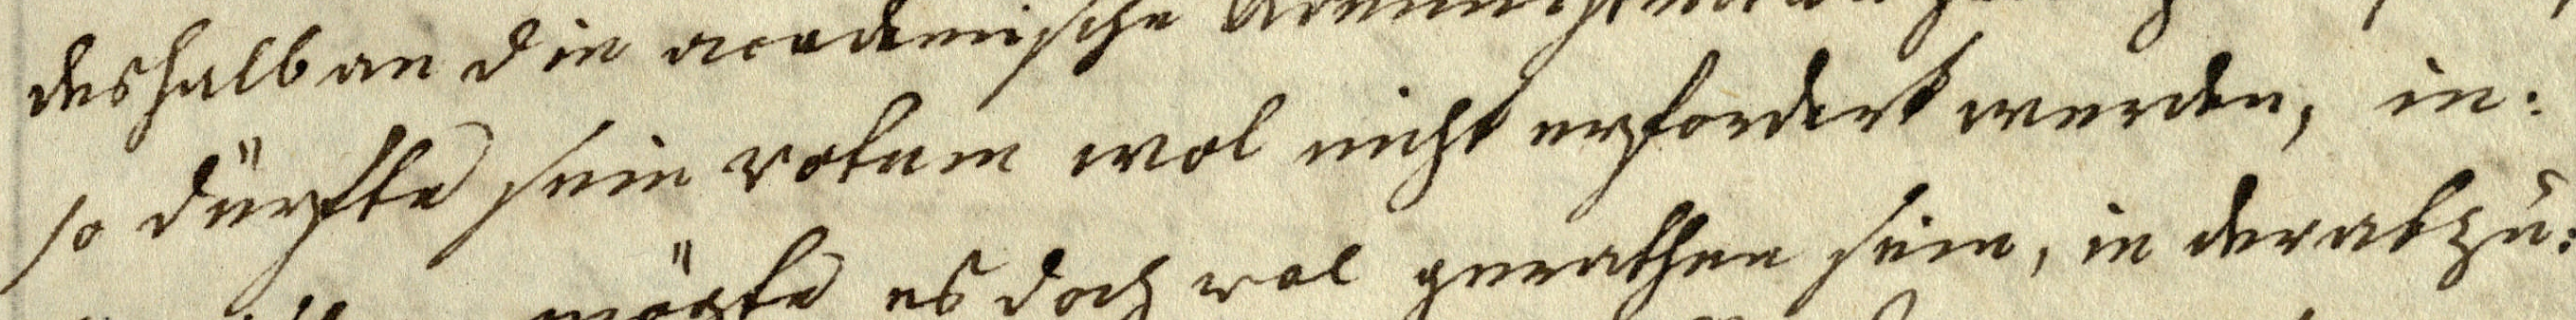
so dürfte sein votum wol nicht erfordert werden, in¬
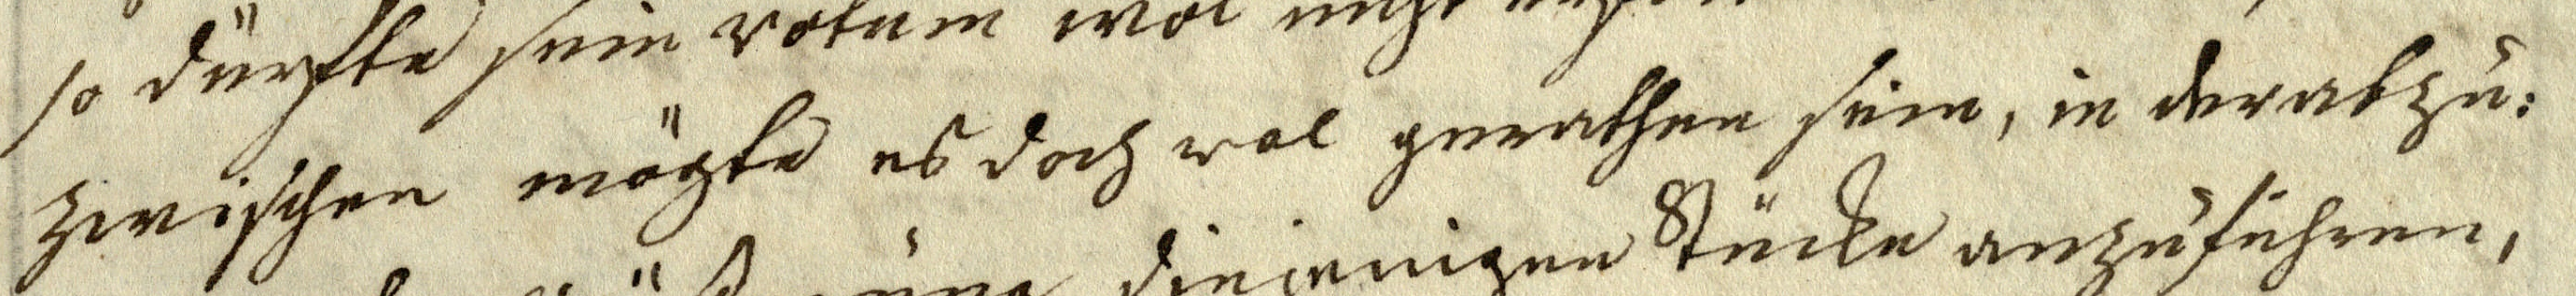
zwischen mögte es doch wol gerathen sein, in der abzu¬
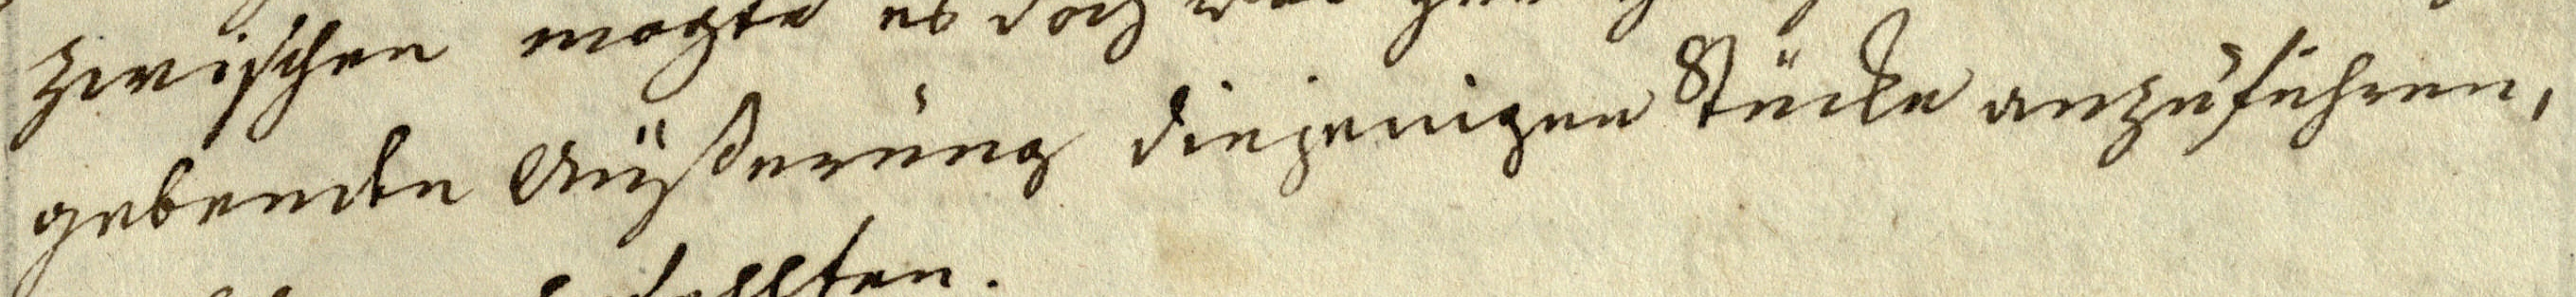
gebenden Äußerung diejenigen Stücke anzuführen,
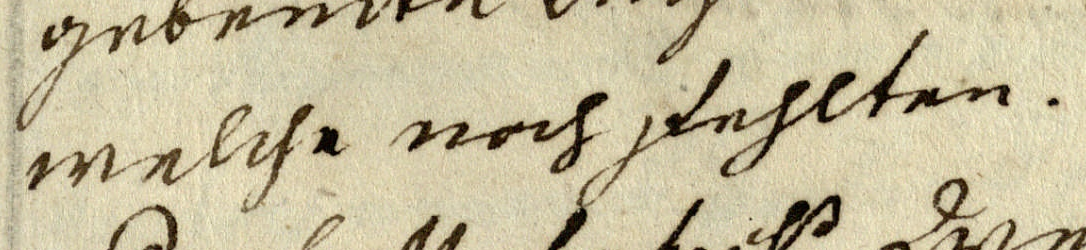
welche noch fehlten.
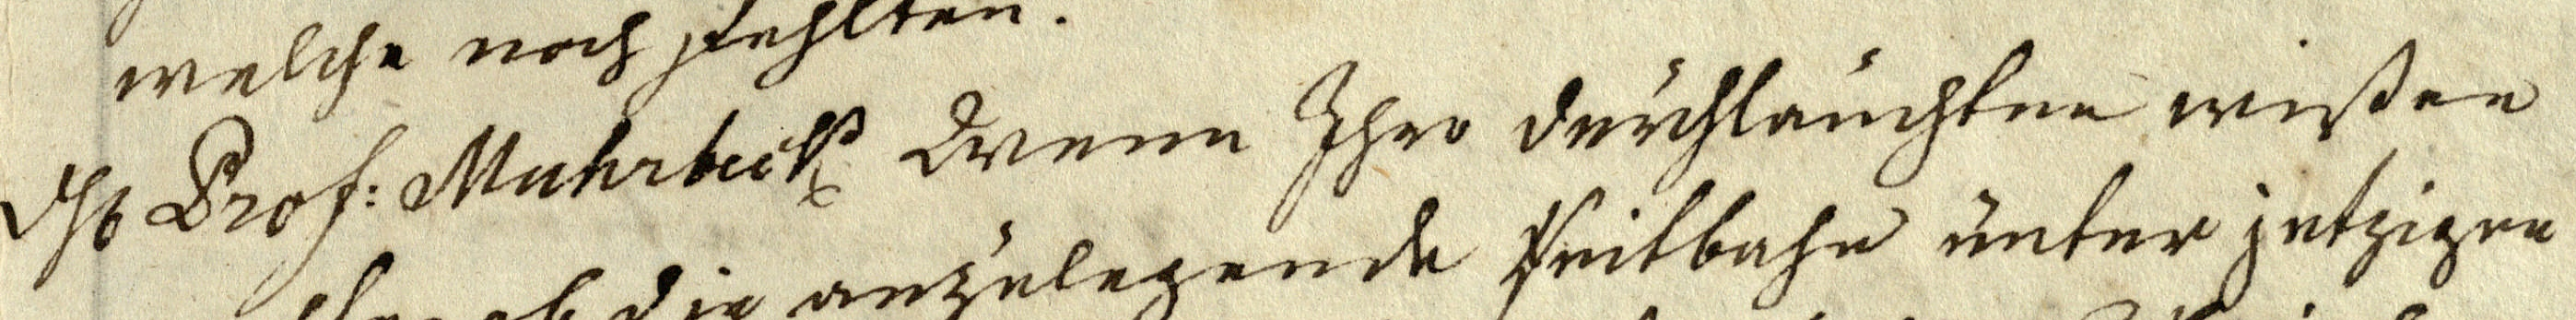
dh Prof. Muhrbeck Wenn Ihre Durchlauchten wißen
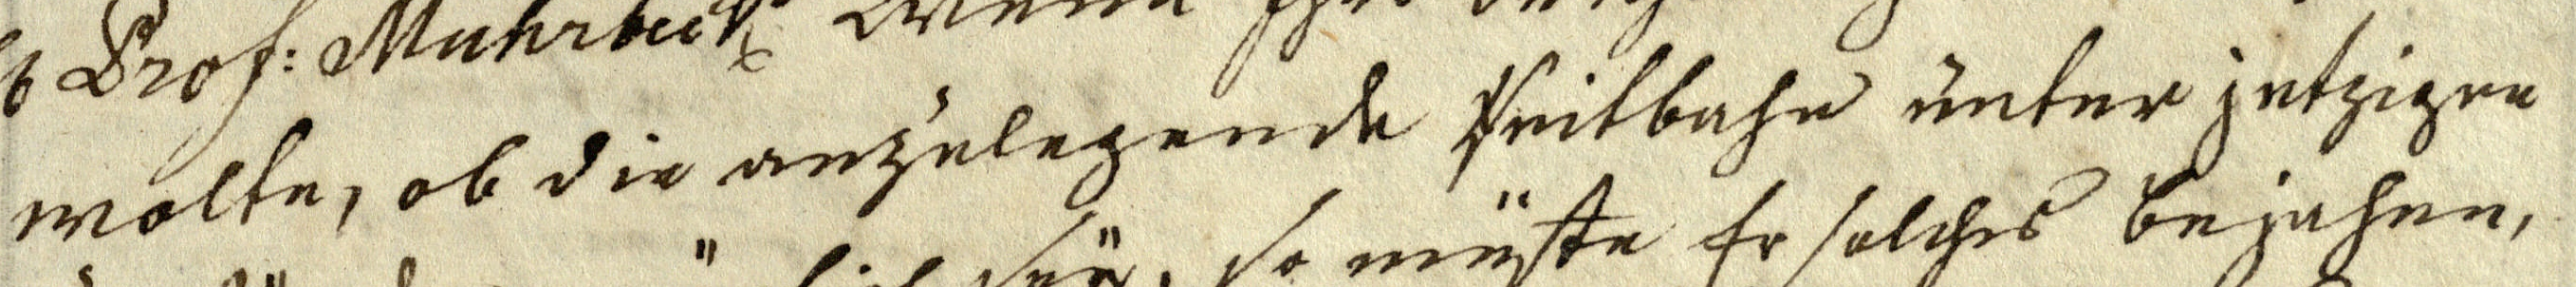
wolte, ob die anzulegende Reitbahn unter jetzigen
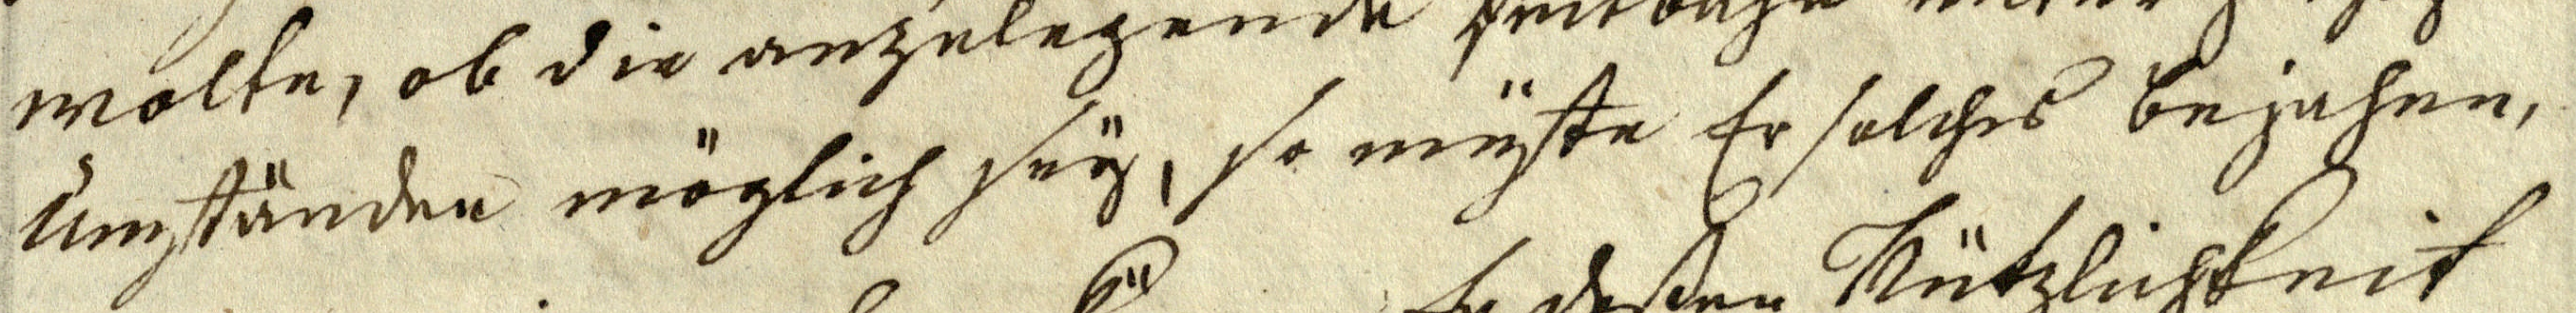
Umständen möglich seÿ, so müste Er solches bejahen,
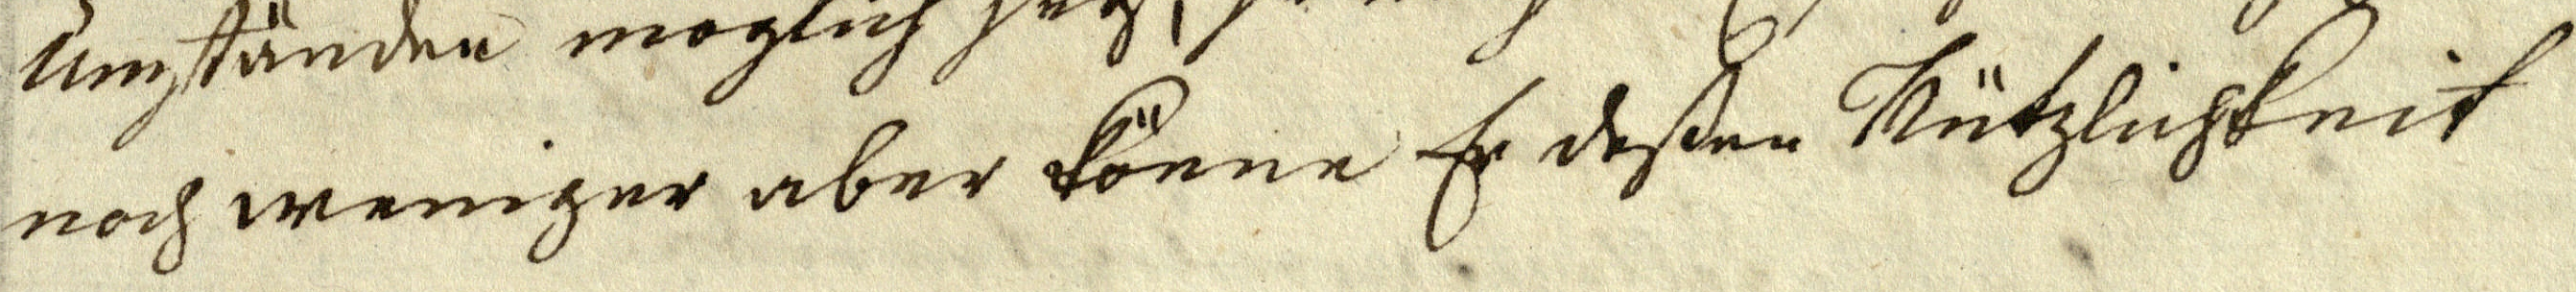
noch weniger aber könne Er deßen Nützlichkeit
